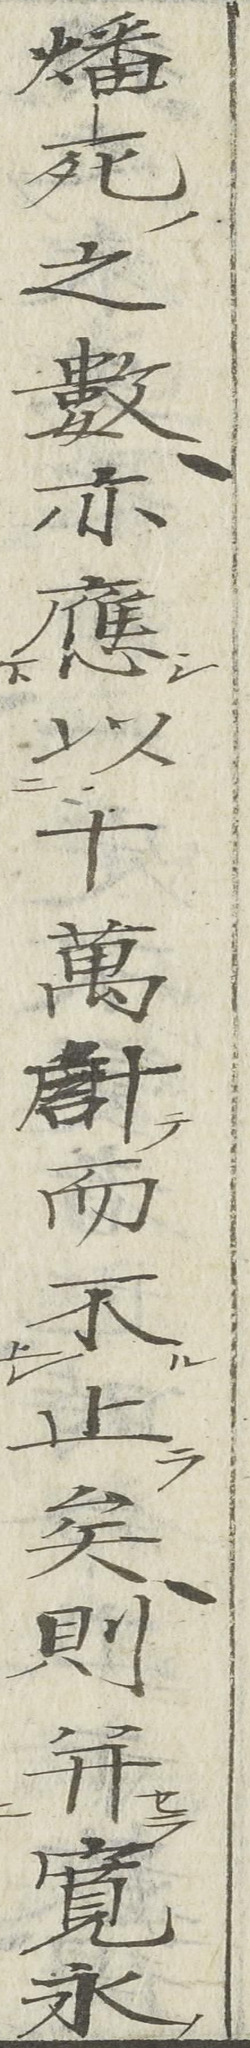燔死之者、亦応以十萬計而不止矣、則并寛永
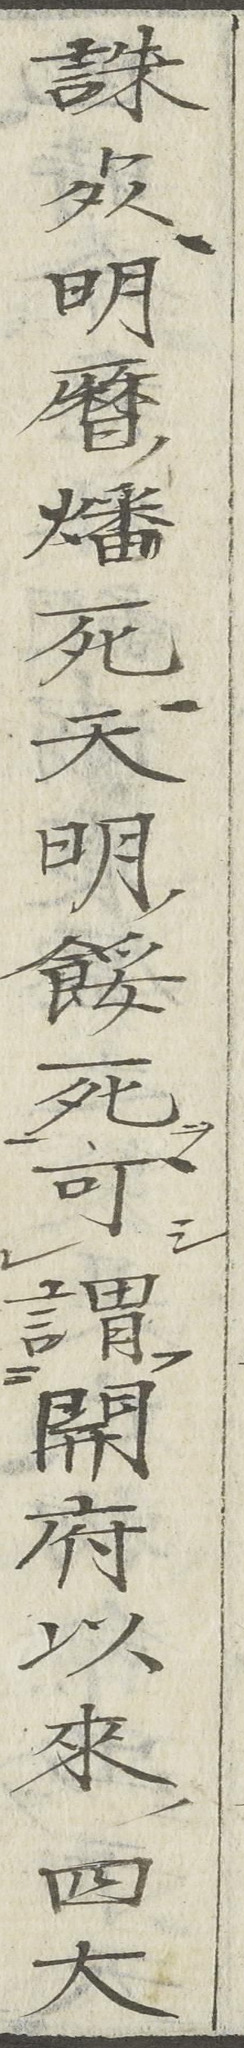誅死、明暦燔死、天明餒死、可謂開府以来四大
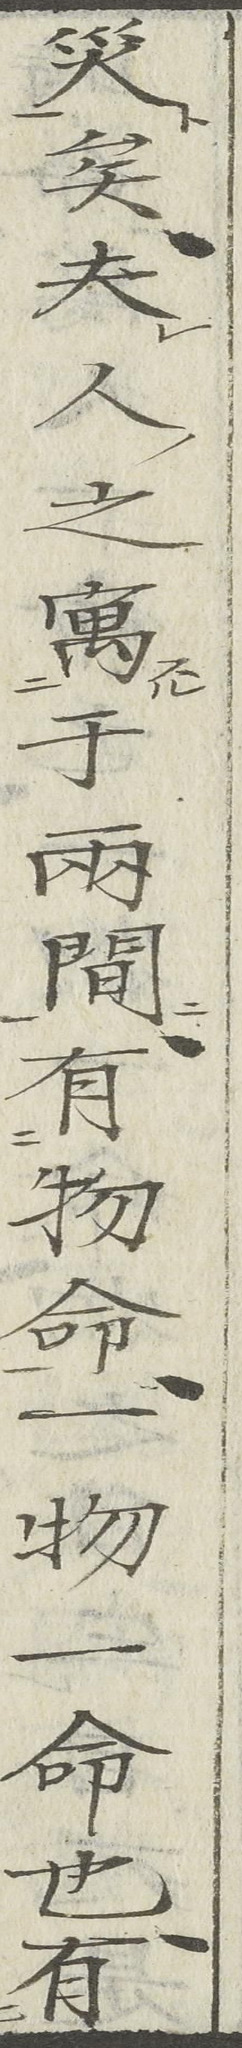災矣、夫人之寓于両間、有物命、一物一命也、有

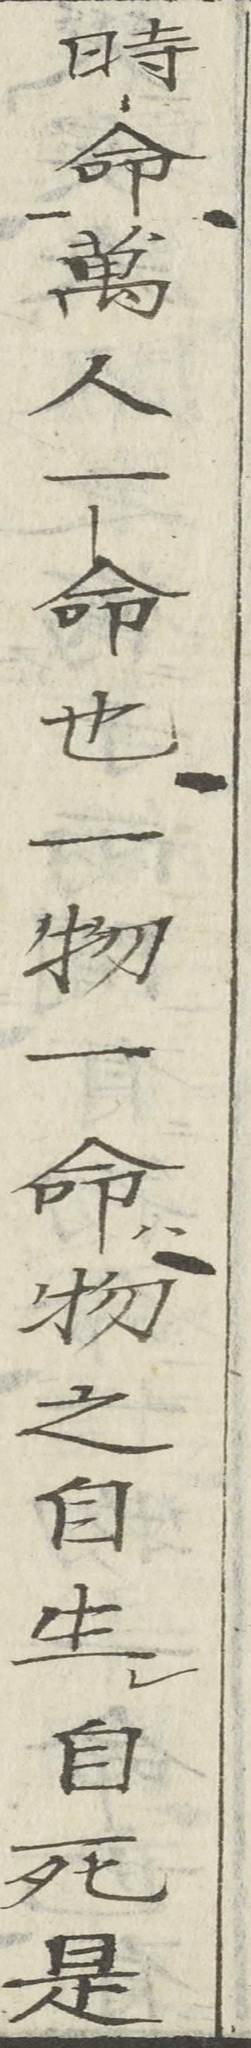時命萬人一命也、一物一命、物之自生自死是
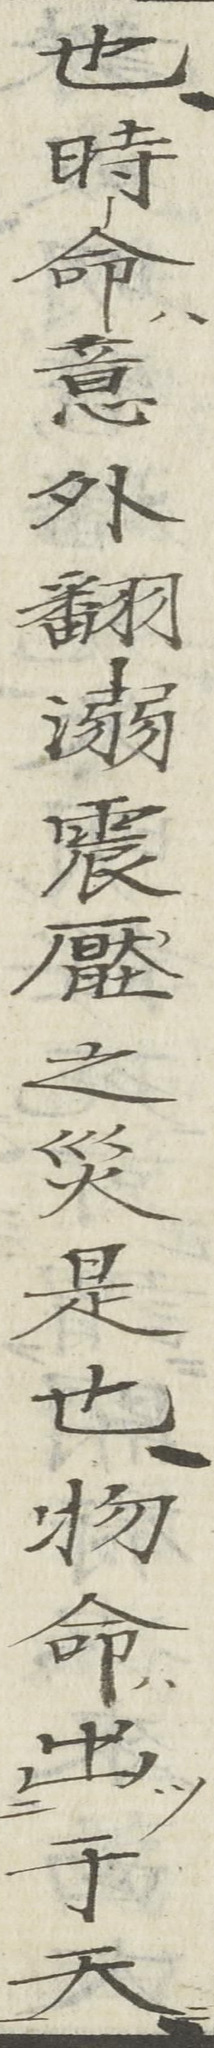也、時命息外翻溺震圧之災是也、物命出于天
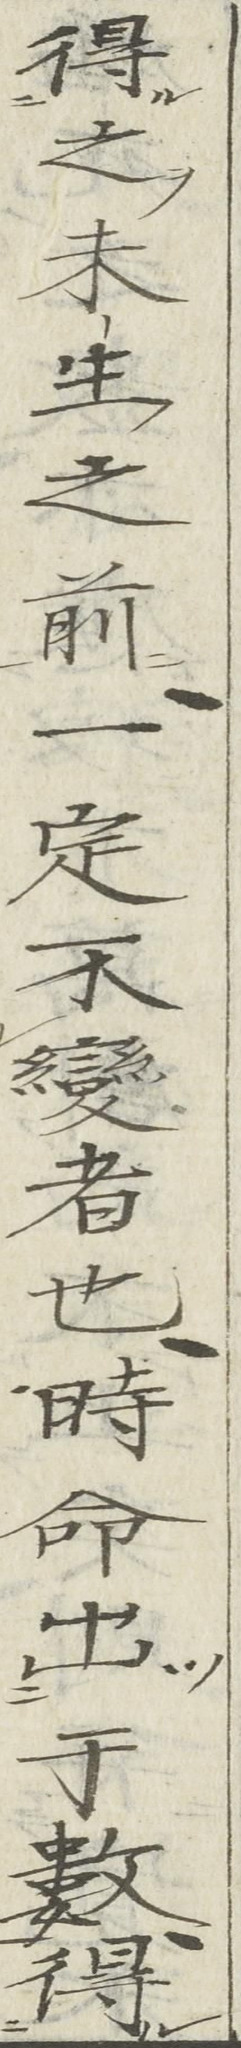得之未生之前、一定不変者也、時命出于数得
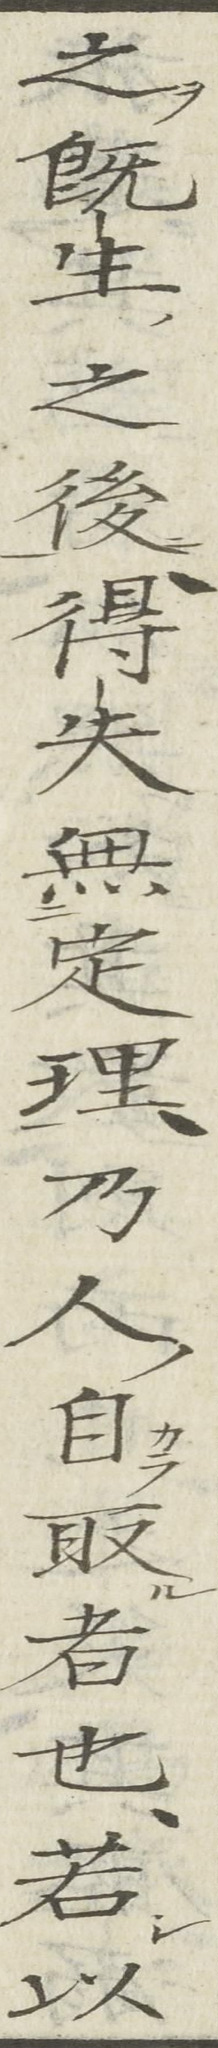之既生之後、得失無定理、乃人自取者也、若以
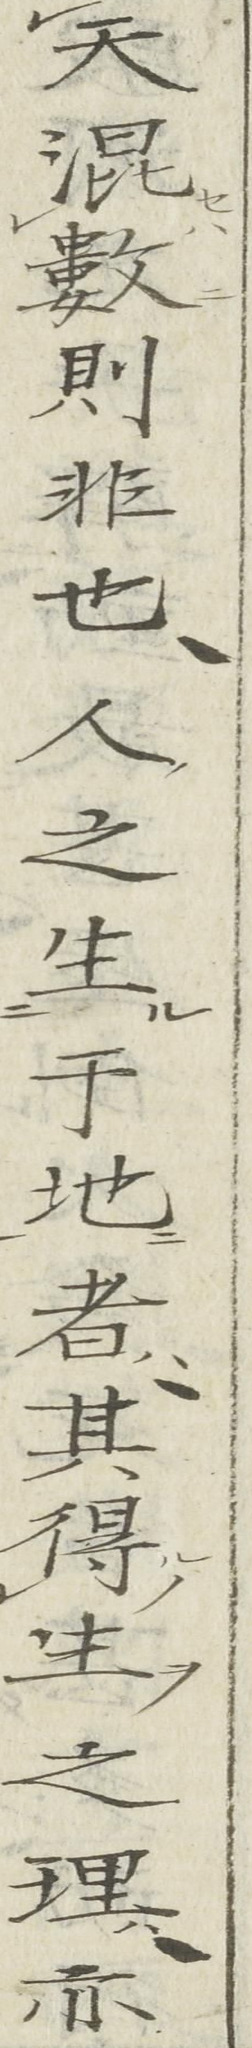天混数則非也、人之生于地者、其得生之理、亦
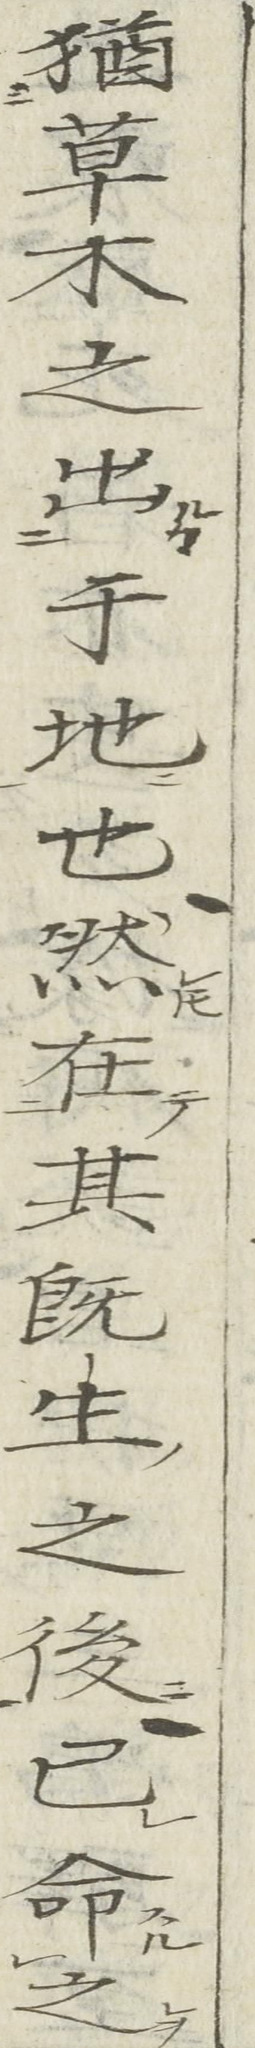猶草木之出于地也、然在其既生之後、已命之
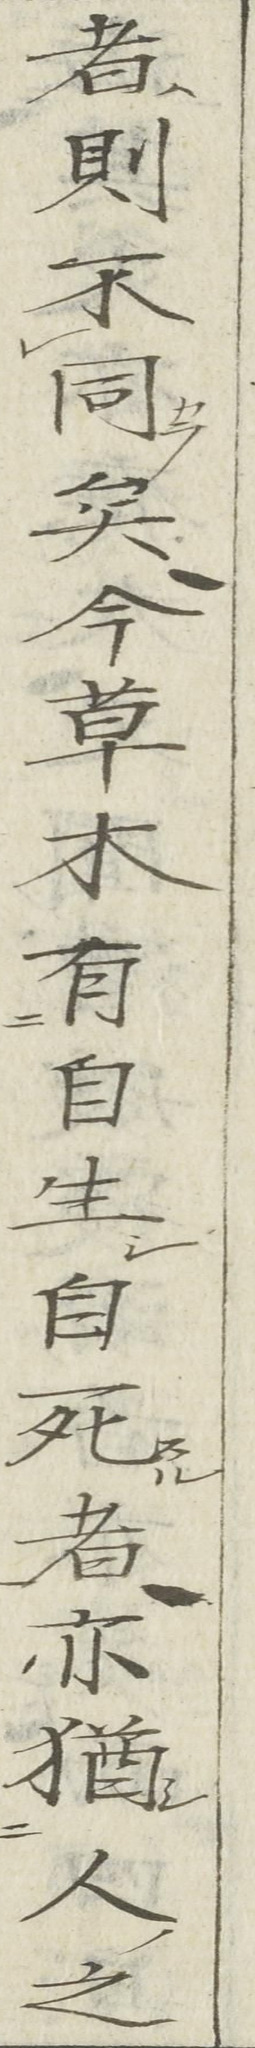者則不同矣、今草木有自生自死者、亦猶人之
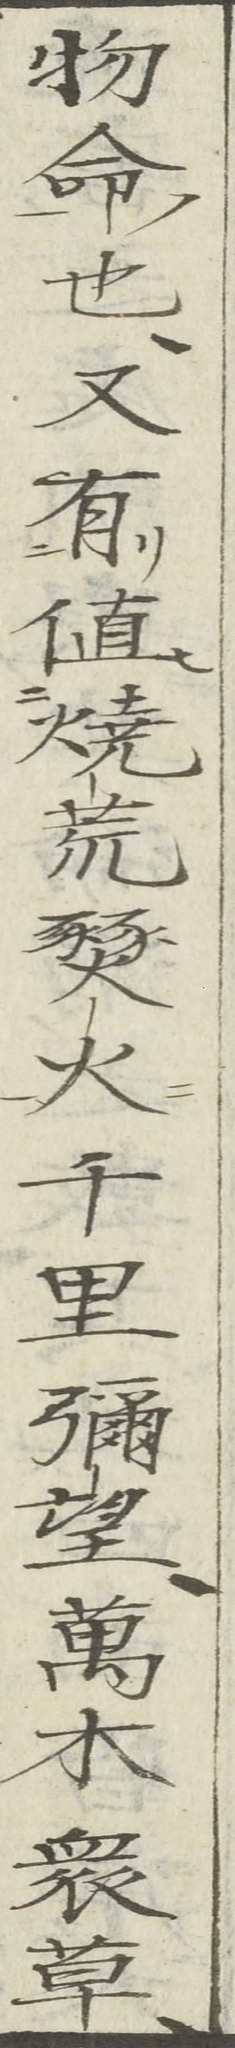物命也、又有値焼荒燹千里弥望、萬木衆草、
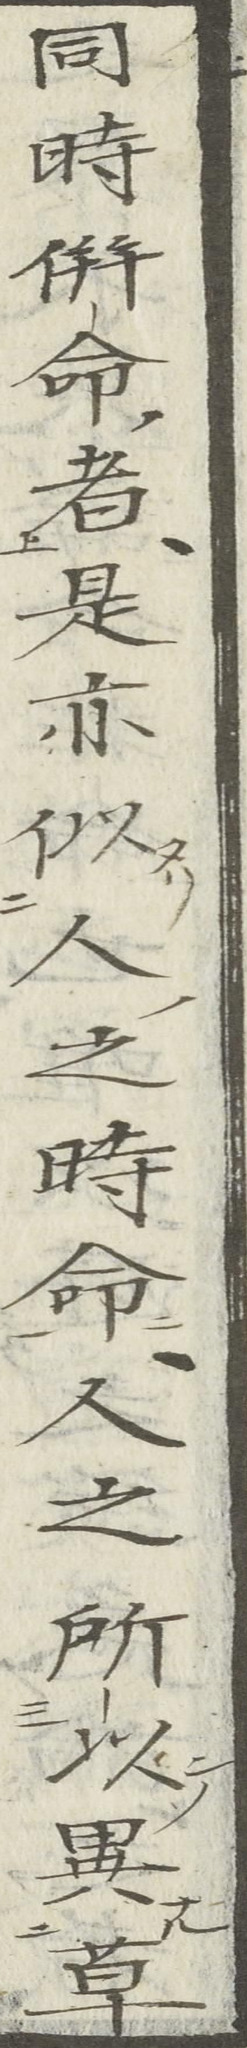同時併命者、是亦似人之時命、人之所以異草
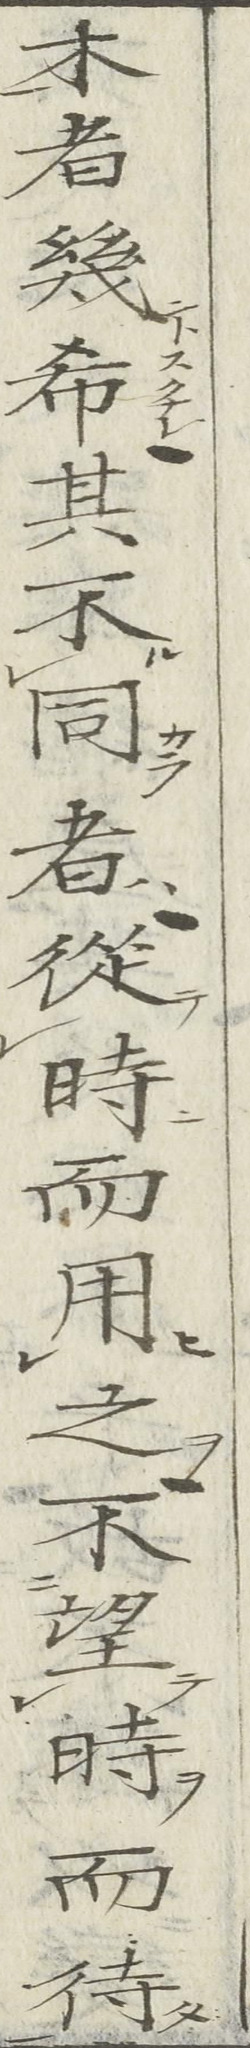木者幾希、其不同者、従時而用之、不望時而待
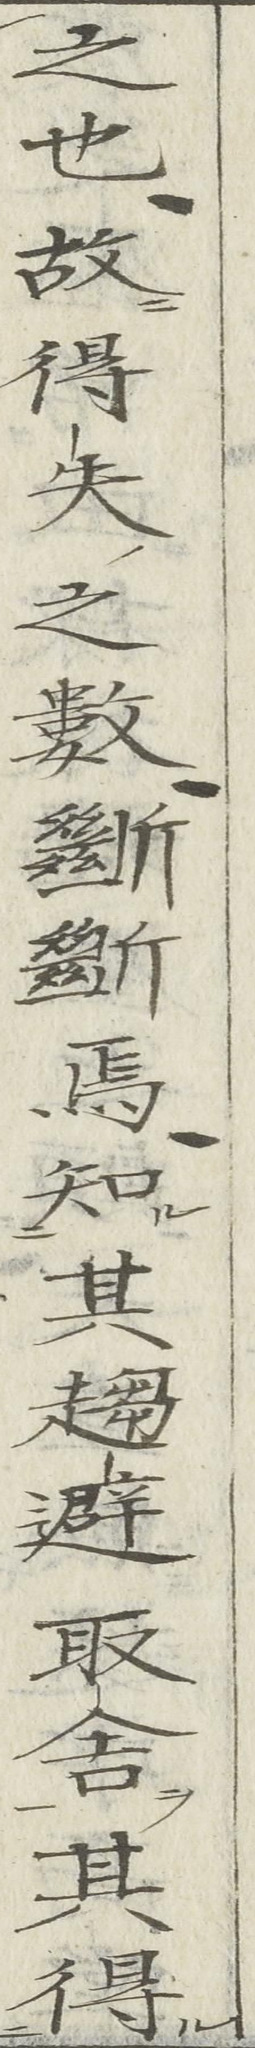之也、故得失之数、断断焉、知其趨避取舎其得
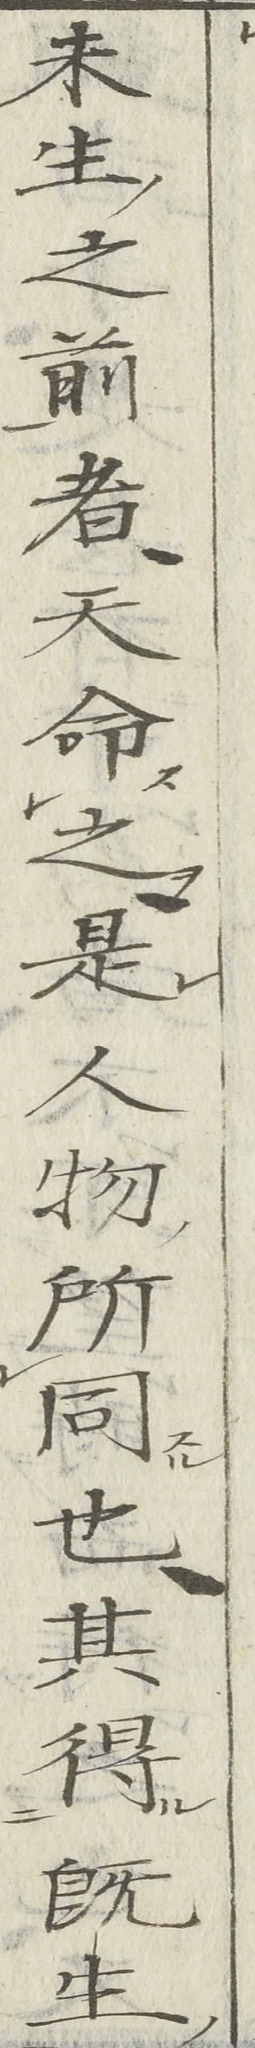未生之前者、天命之、是人物所同也、其得既生
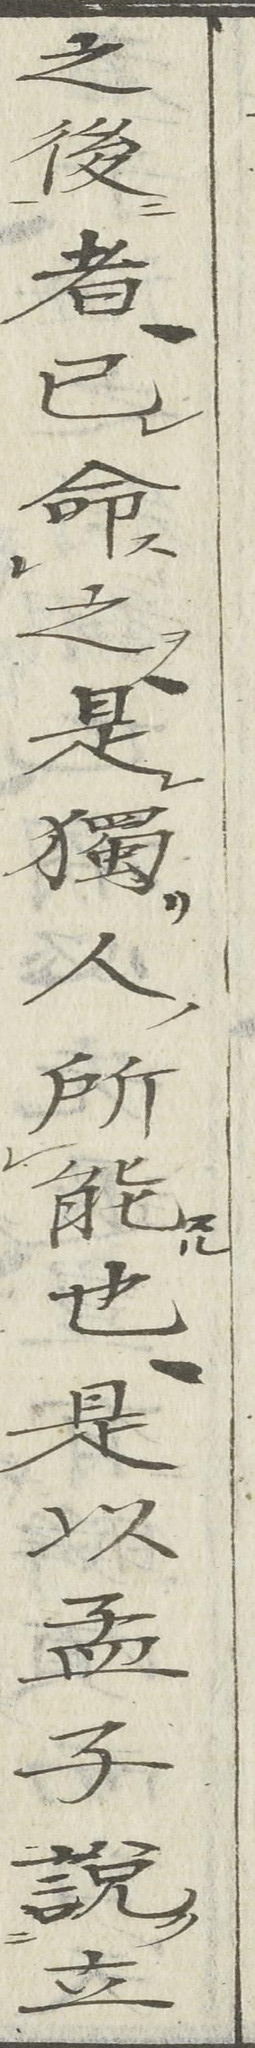之後者、已命之、是独人所能也、是以孟子説立
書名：海翻考　全
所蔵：東京大学地震研究所図書室 Earthquake Research Institute Library, The University of Tokyo, JAPAN
